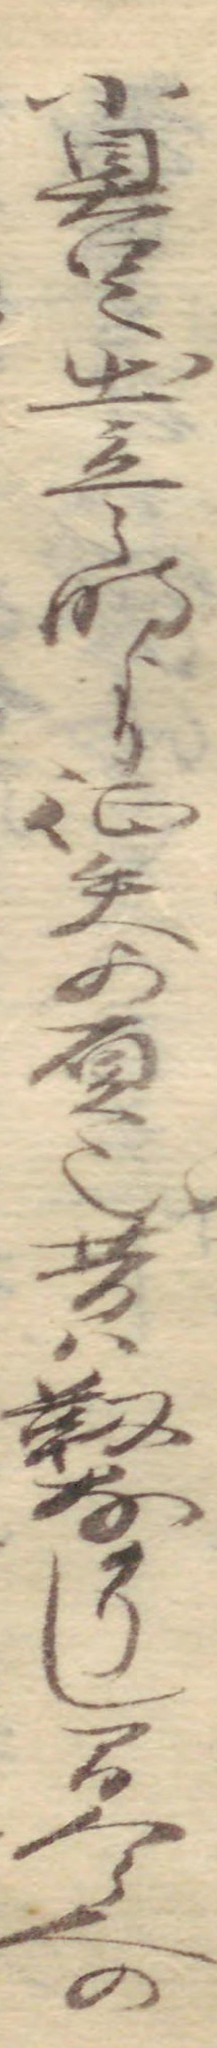一小具足出立の時より征矢可負也昔は靭なかりし間今人の
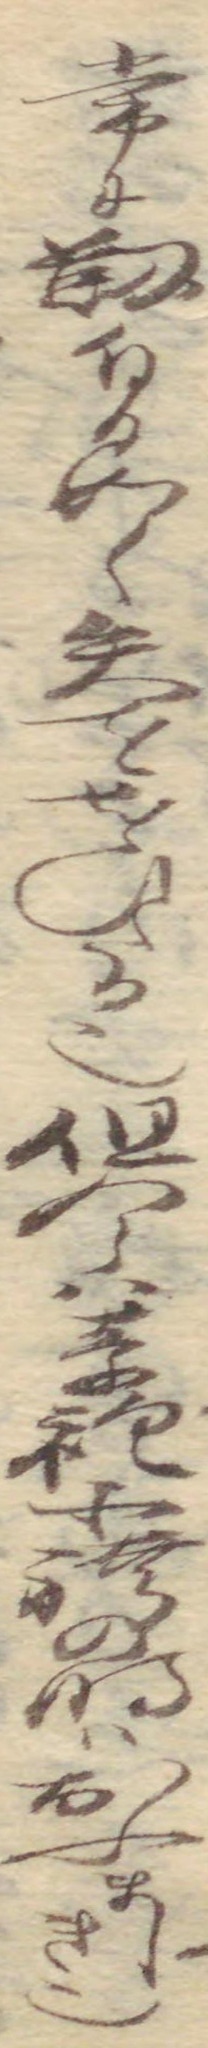常に靭付る如くやををひたる也但今は素袍小袴の時ハおふましき也
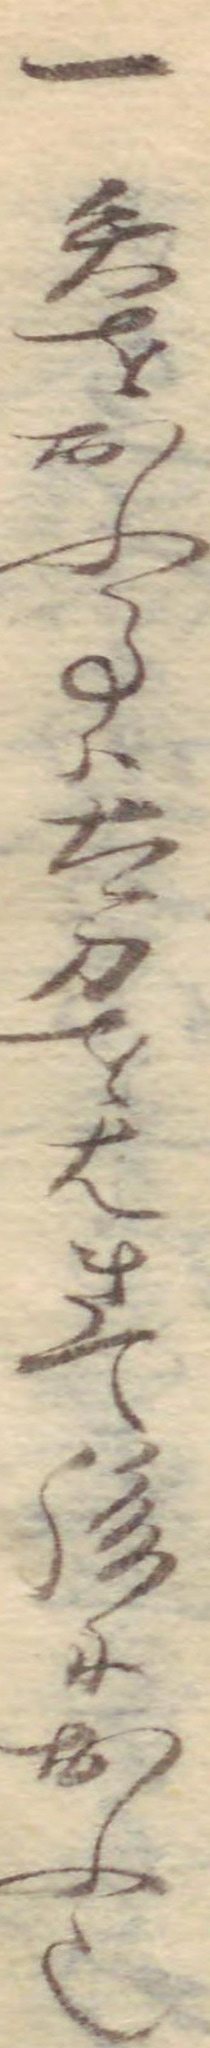一矢をおふ事ハ太刀をはきて後におふ也
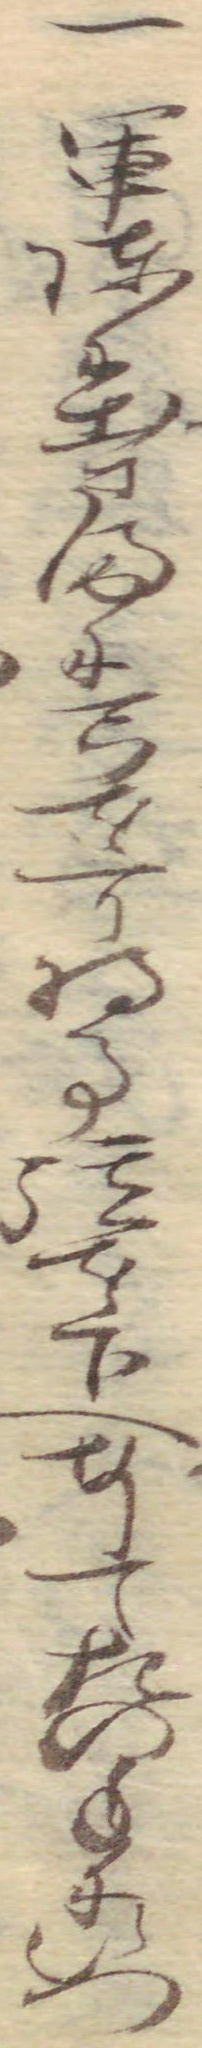一軍陣に出さまに弓を可持事弦を下へなして左の手にひつ
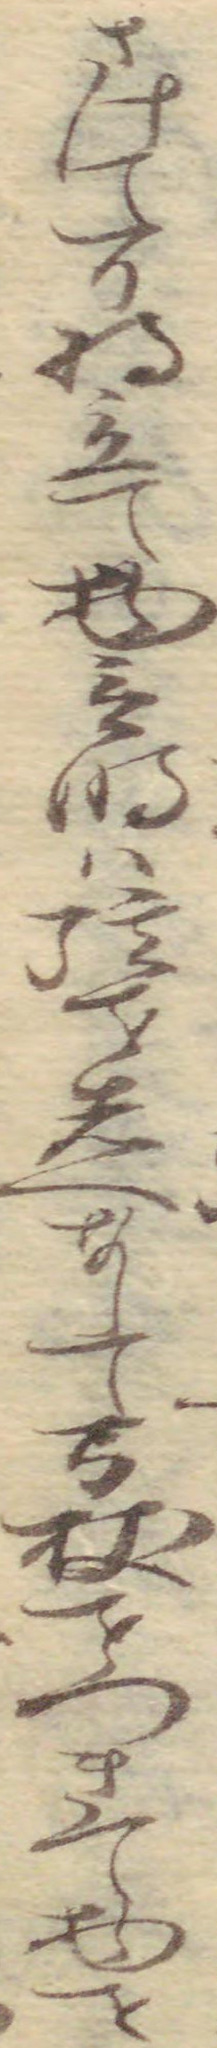さけて可持立て物言時ハ弦を先へなして弓杖をつきて物を
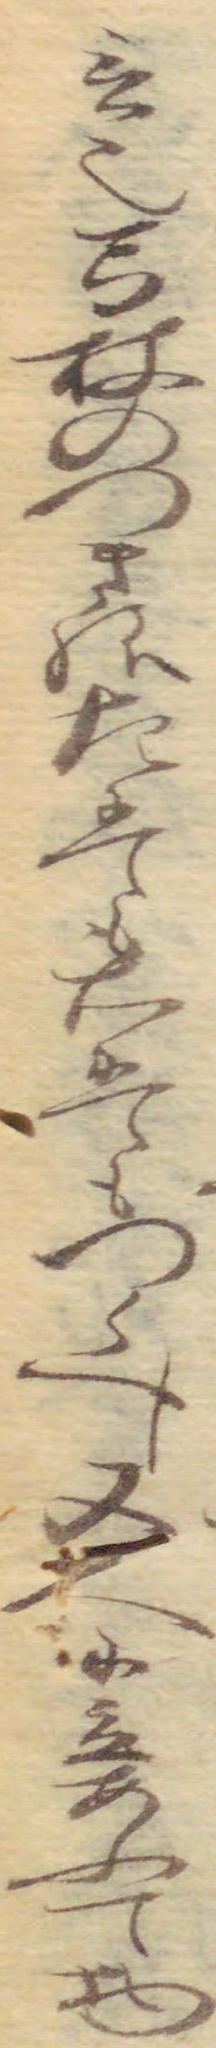言也弓杖のつき様左にても右にてもつくへし又人に立あふて物

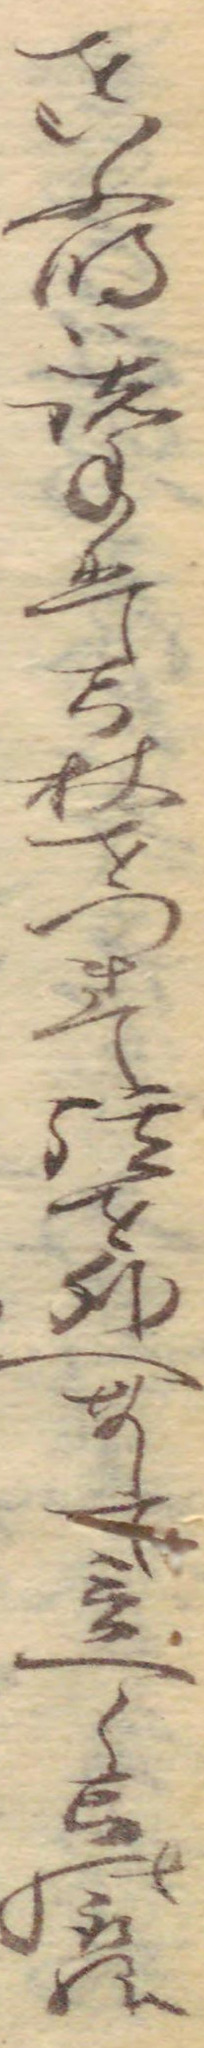をいふ時ハ諸手にて弓杖をつきて弦を外へなして言へく弓の取様
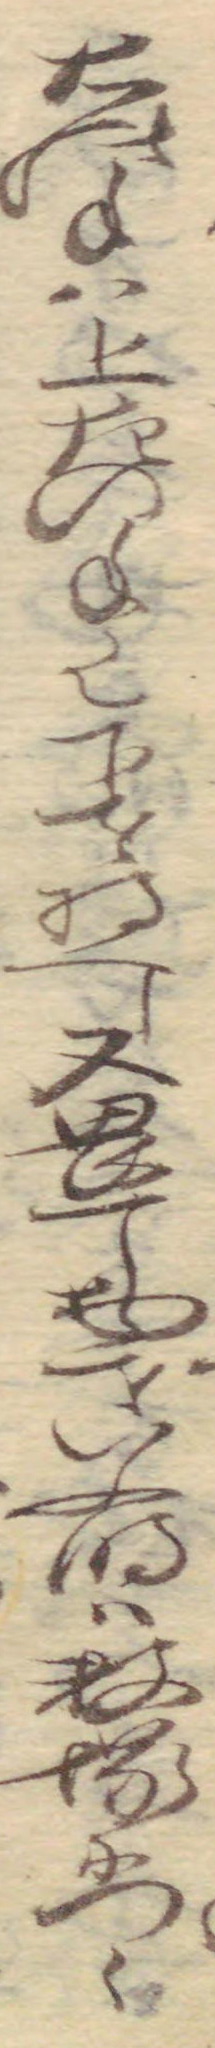右の手ハ上左の手ニて下を持へし又畏て物をいふ時ハ数塚につく
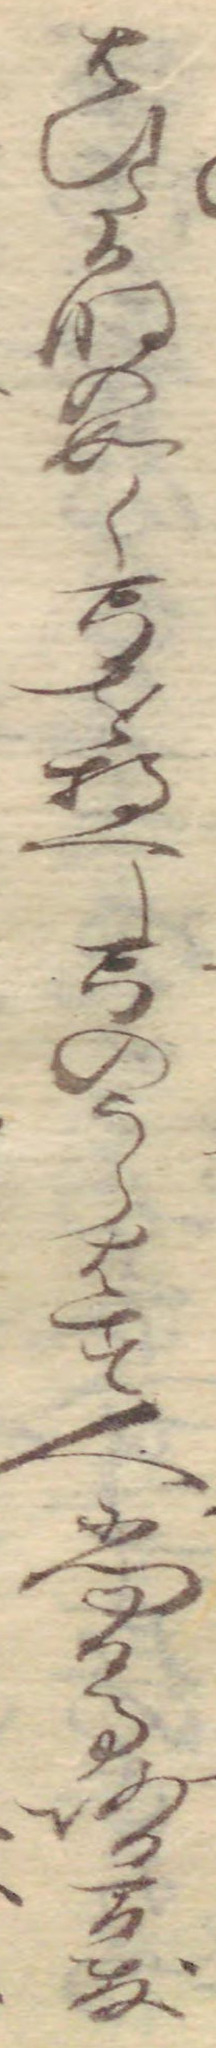はいたる時の如く弓を持へし弓のうらはす人に向る事ある間敷
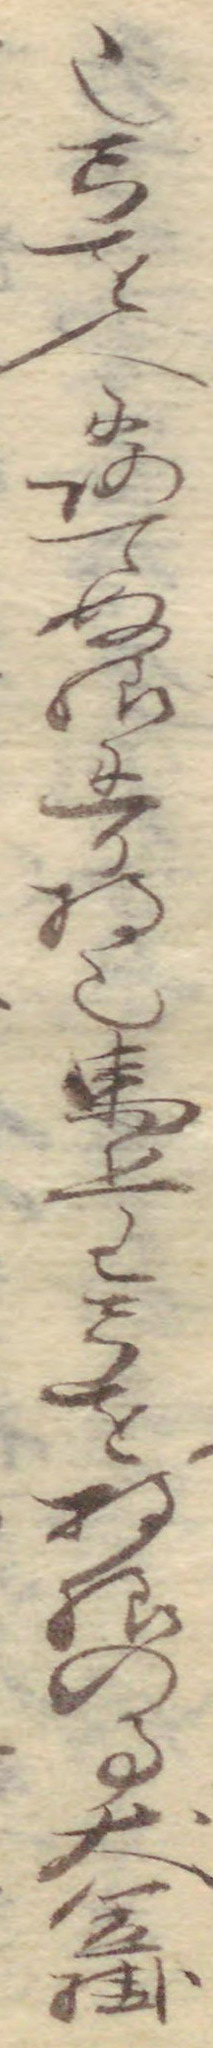也弓を人にあてぬ様に可持也馬上ニて弓を持様の事犬笠掛
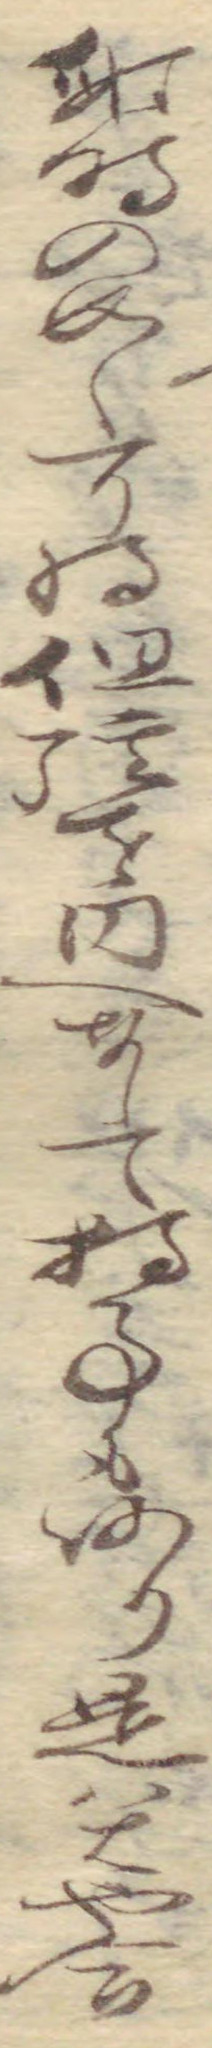射時の如く可持但弦を内へなして持事もあり是ハはや合
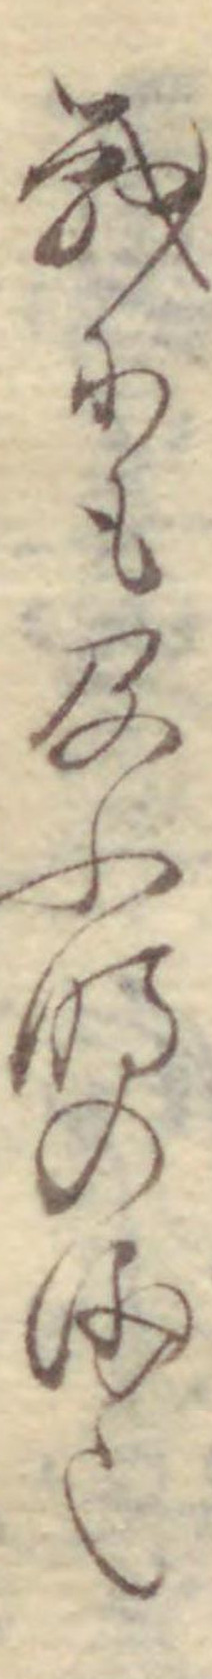戦にも及ふ時の儀也
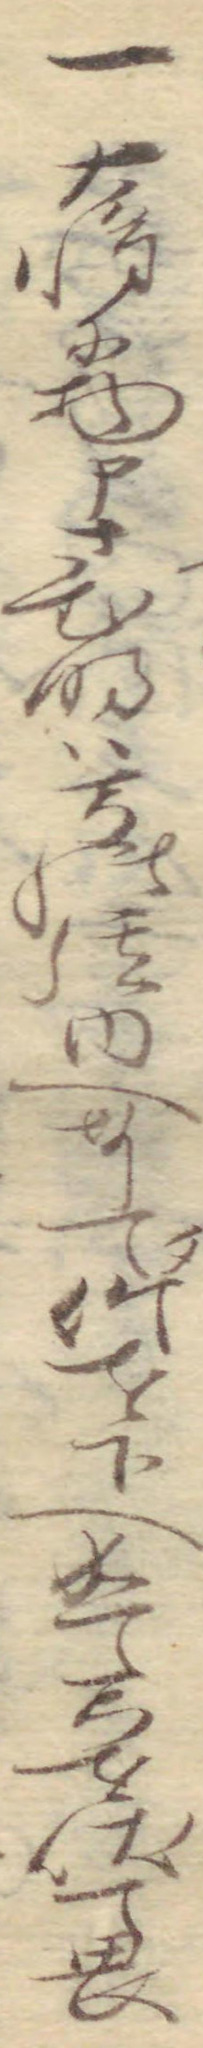一大将に物申さむ時ハ弓の弦内へなして外竹を下へ成て弓を伏て畏
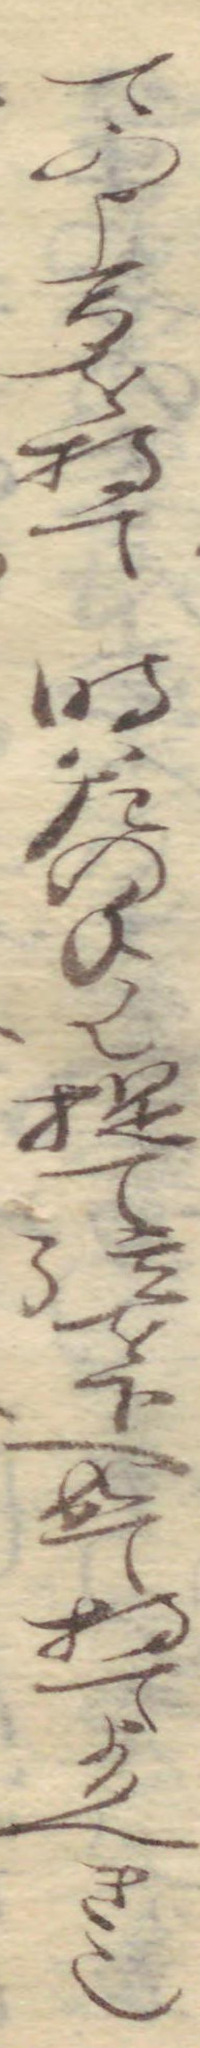て可申弓を持て時ハ左の手ニて提て弦を下へ成て持てよるへき也
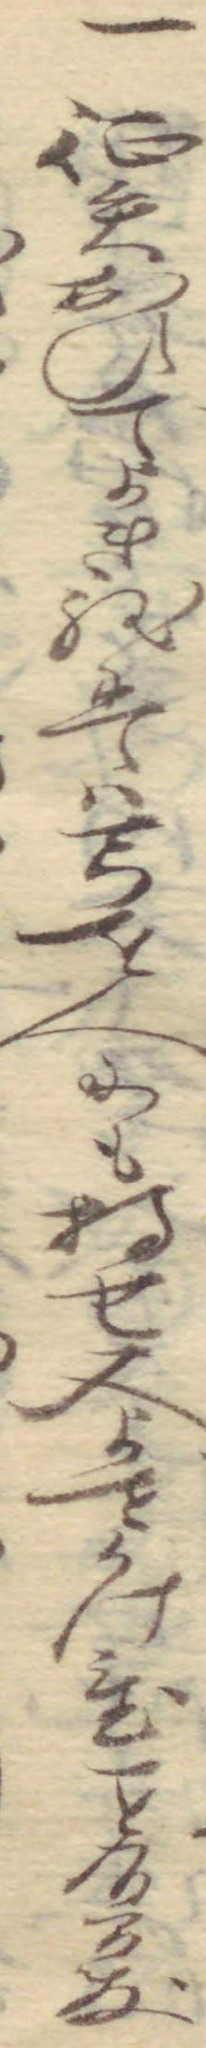一征矢おひてよき程にてハ弓を人にも持せ又よせかけ置こと有間敷
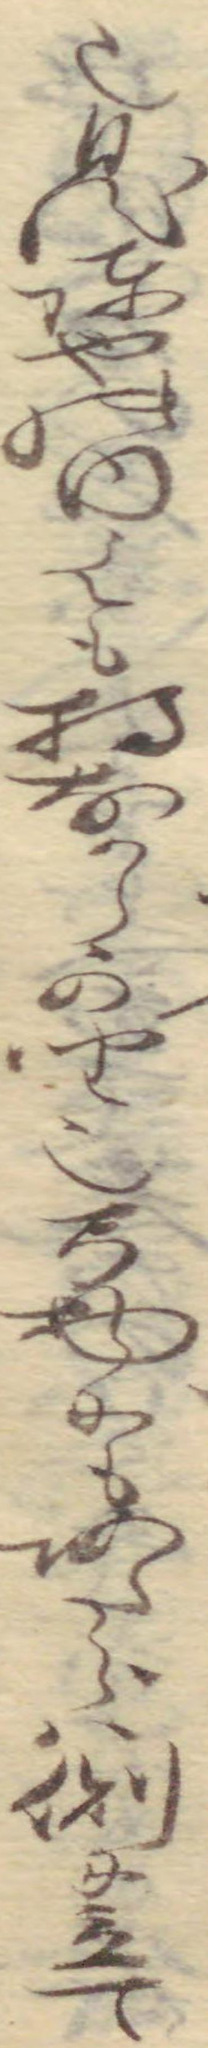也自然陣やの内二ても持なから可座也弓物にもあたらハ側に立て
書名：鶯宿雑記. 巻199-200
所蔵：国立国会図書館 National Diet Library, JAPAN
